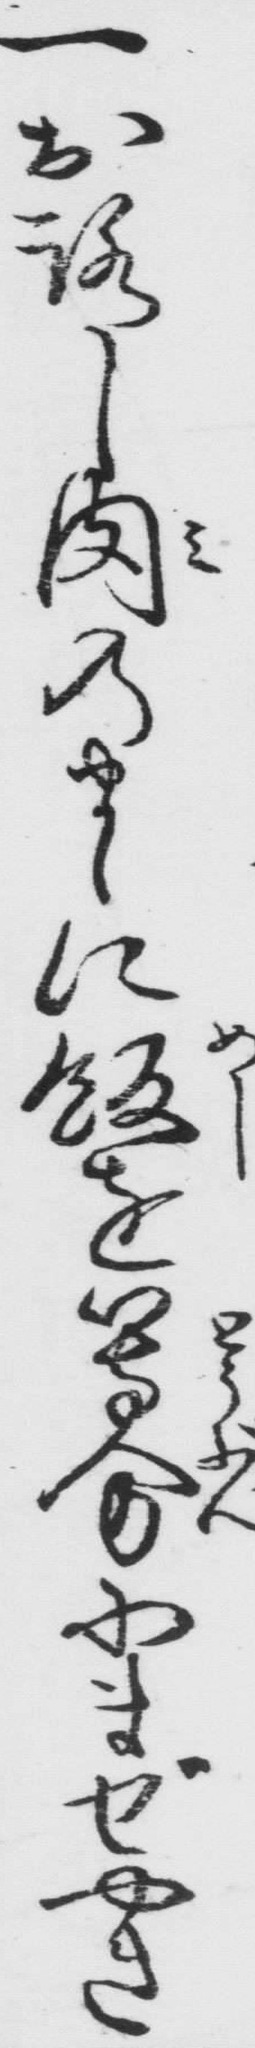一おろし肉のまゝに飯を等分にまぜやき
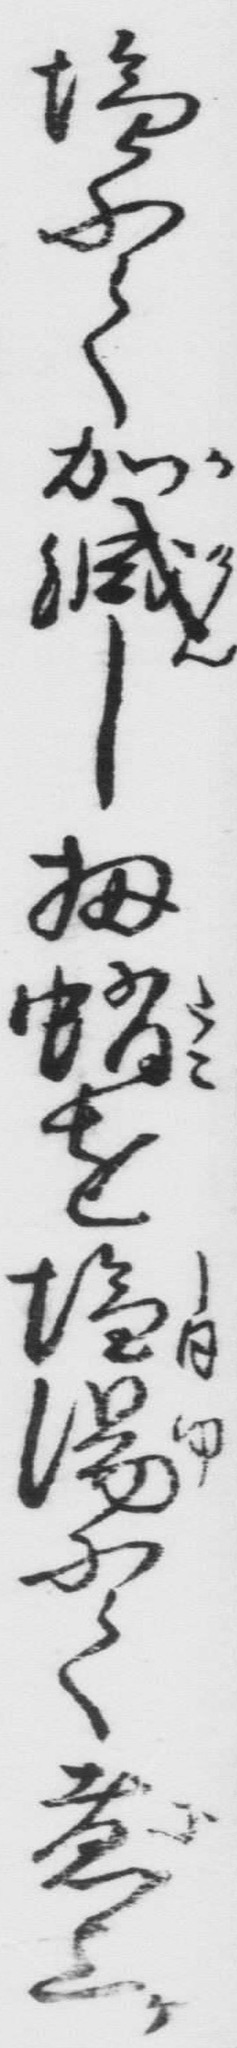塩にて加減し扨蛸を塩湯にて煮上げ
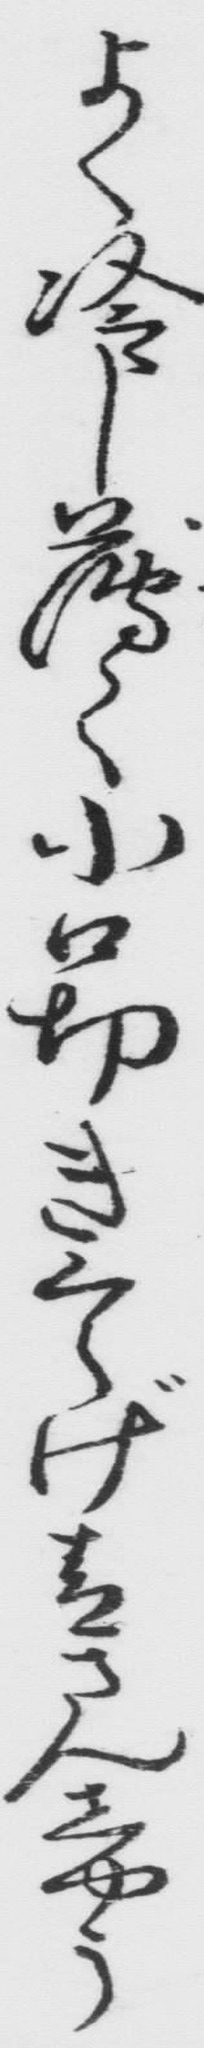よく冷し薄く小口切きくらげ青さんしやう
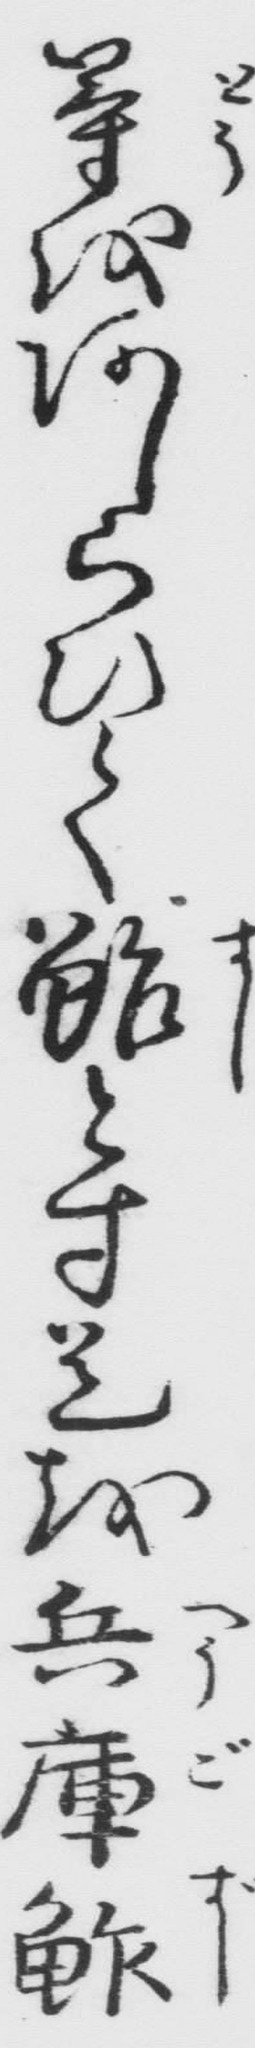等をあしらひて鮓とす是を兵庫鮓
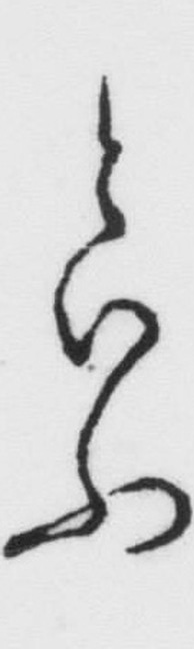といふ
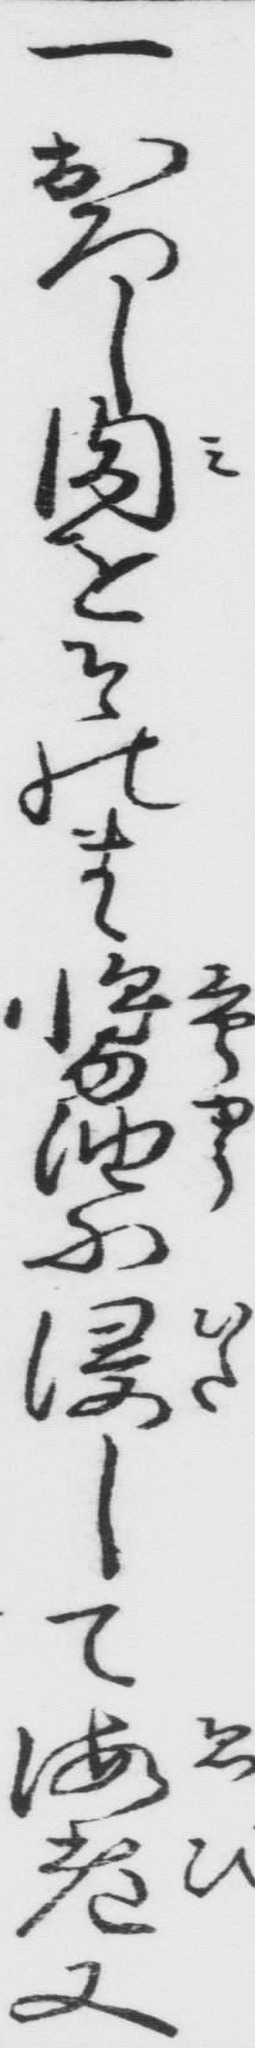一おろし肉をそのまゝ醤油に浸して海老又
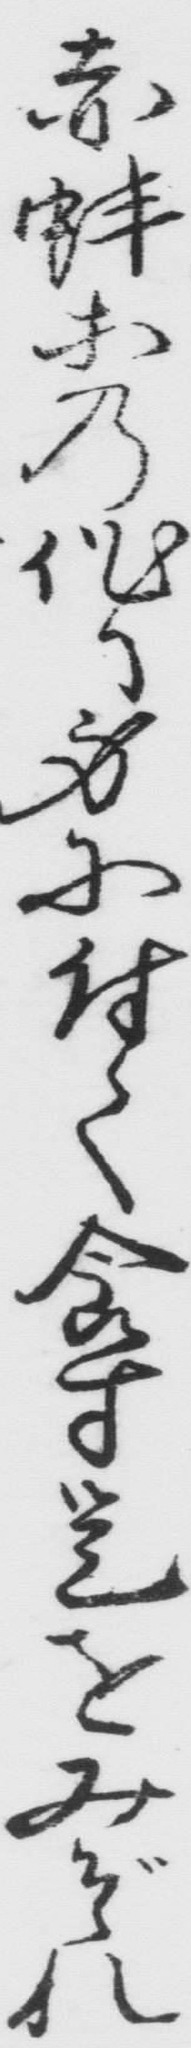赤蚌等の作り身に付て食す是をみぞれ
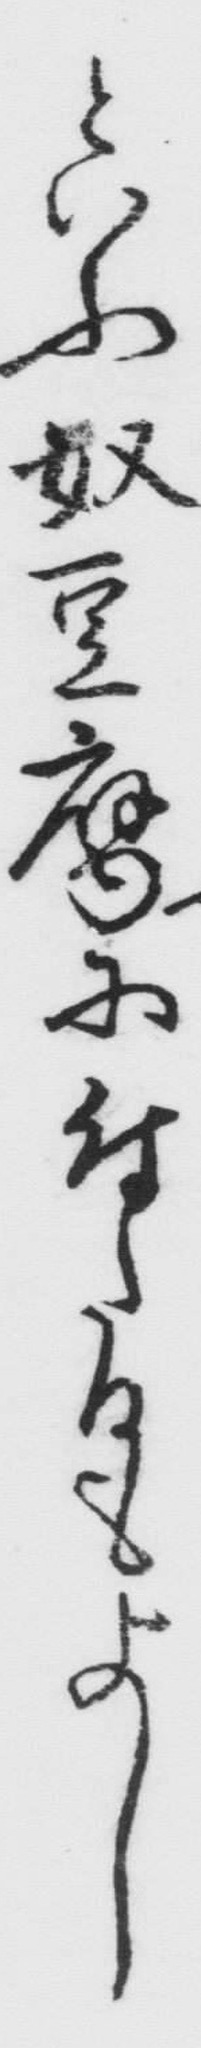といふ奴豆腐に付たるもよし

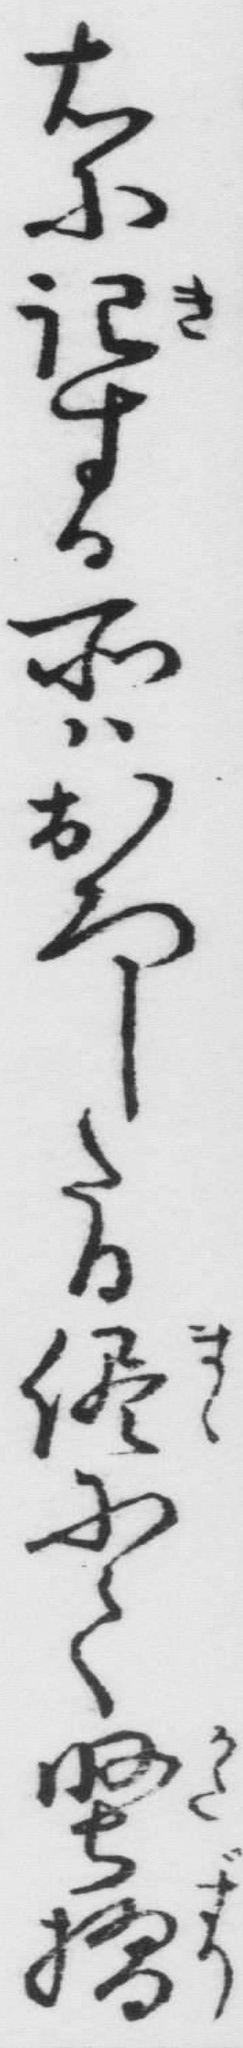右に記する所はおろしたる侭にて堅摺
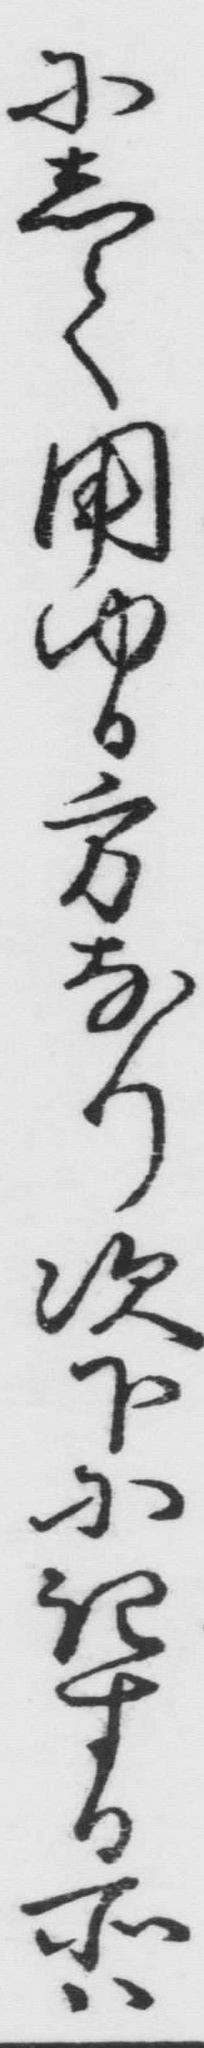にして用ゆる方なり次下に記する所は
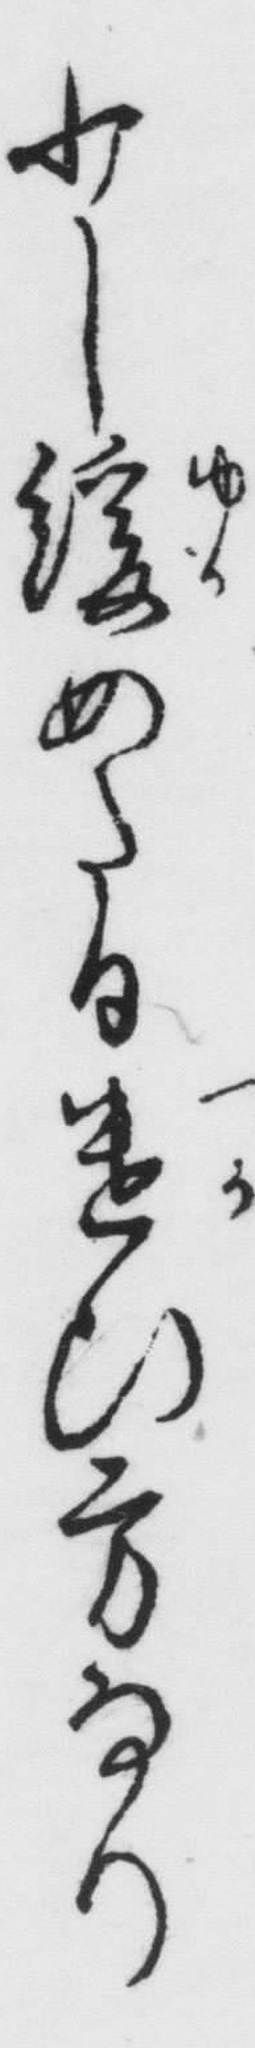少し緩めたる遣ひ方なり
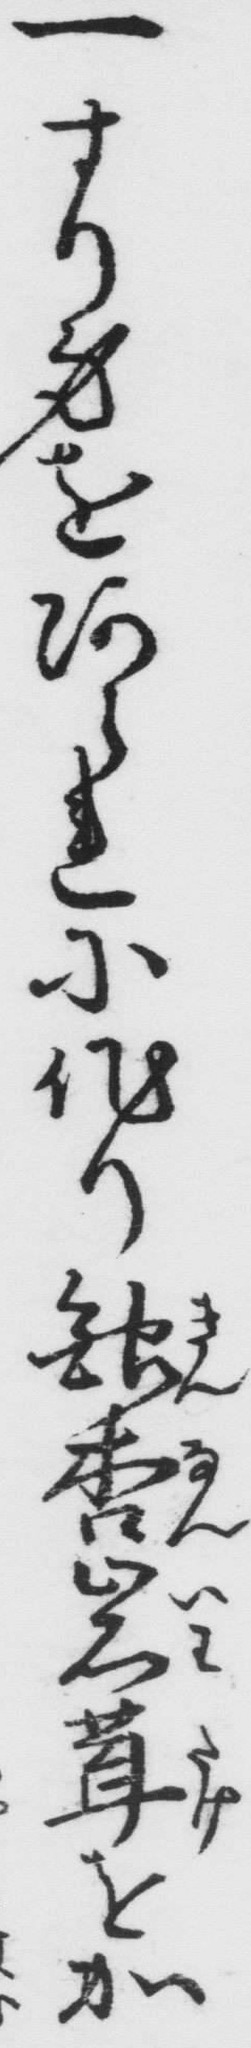一すり身をあられに作り銀杏岩茸を加
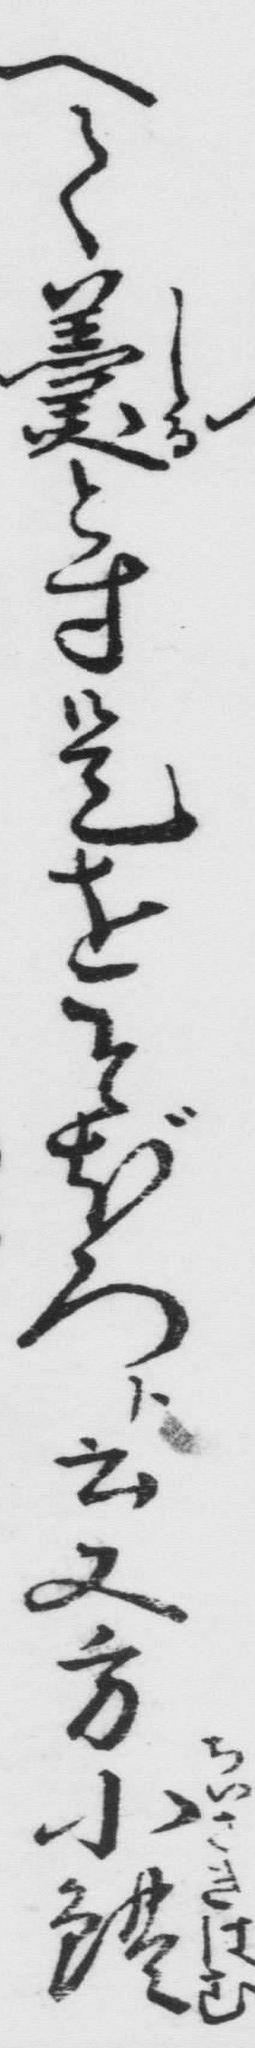へて羹とす是をそばろと云又方小鱧
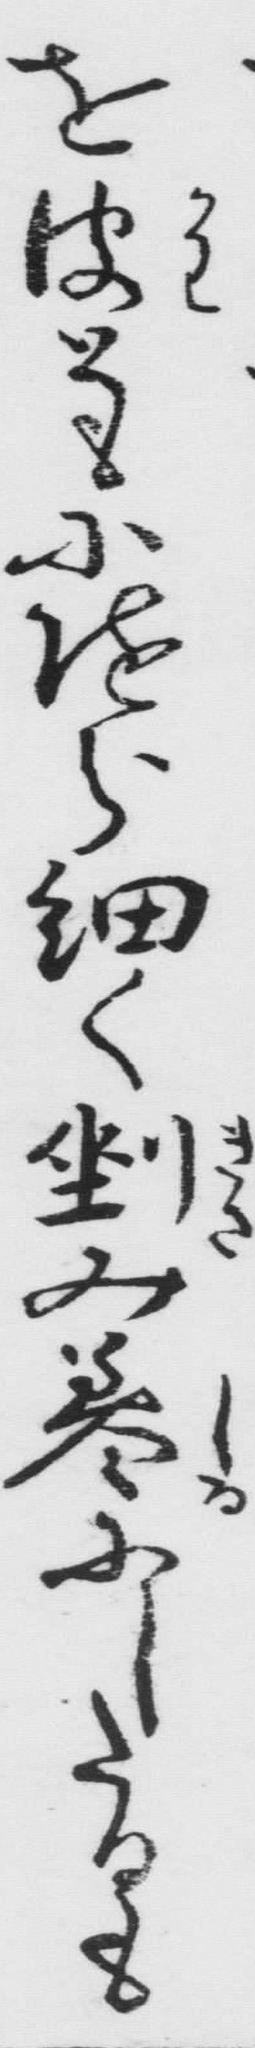を皮ともに随分細く剉み羹にしたるも
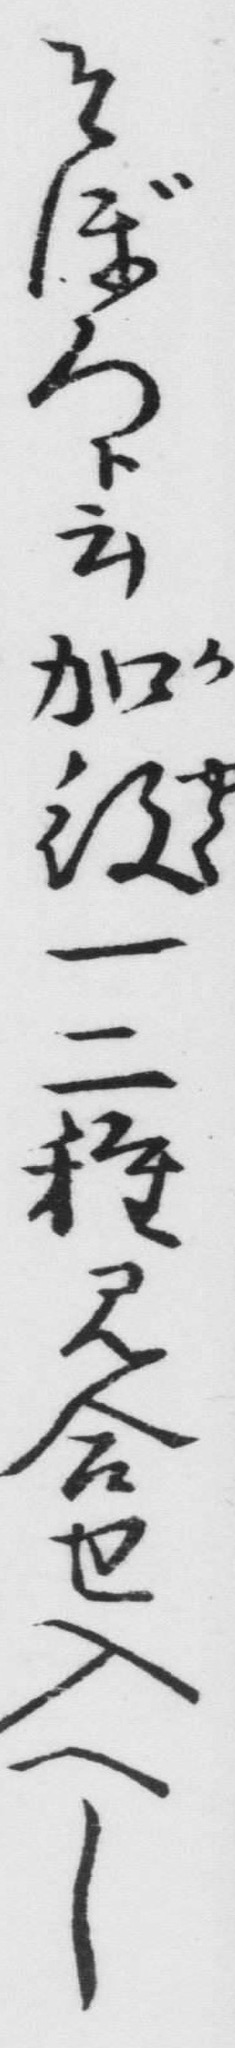そばろと云加役一二程見合せ入へし
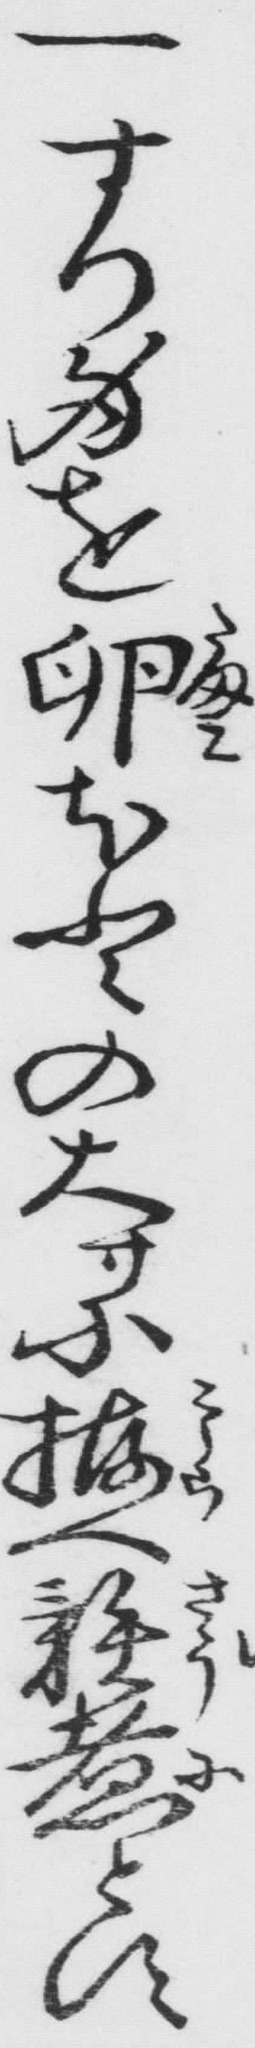一すり身を卵ほとの大さに拵へ雑煮とす
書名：海鰻百珍
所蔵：大阪府立大学学術情報センター 国文学研究資料館
